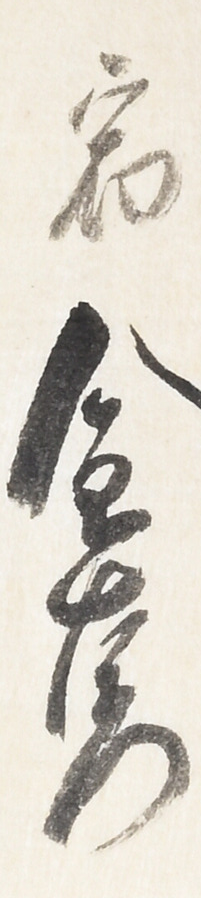宿金右衛門
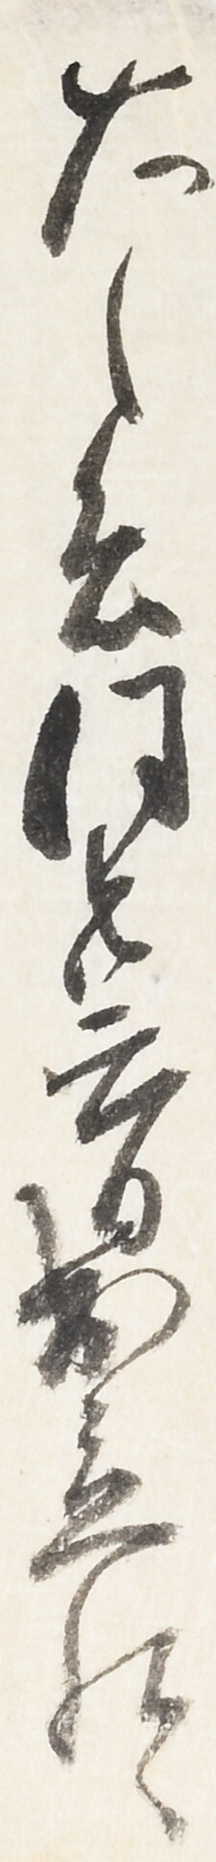右之者同廿九日出立仕候
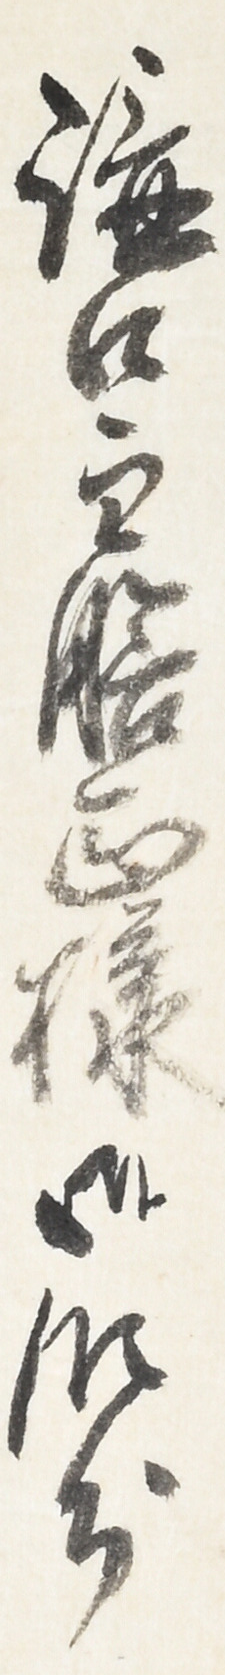講口主膳正様御領分
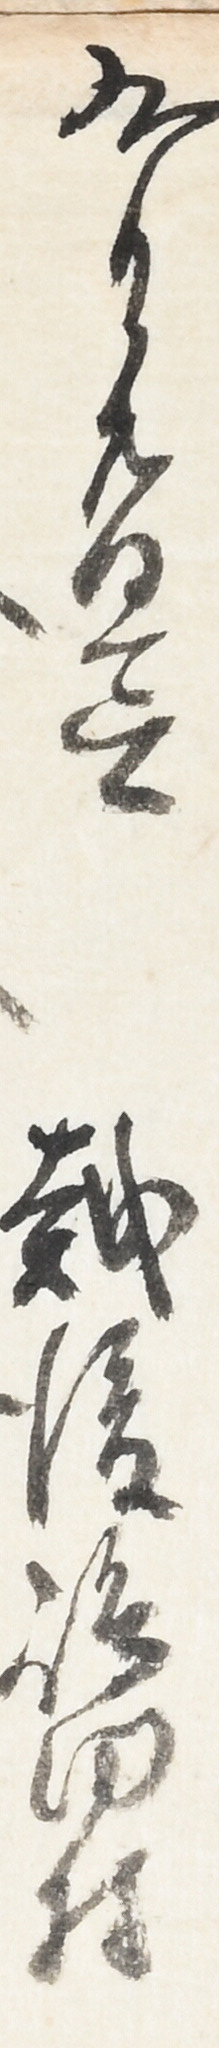九月廿日着越後嶋田村
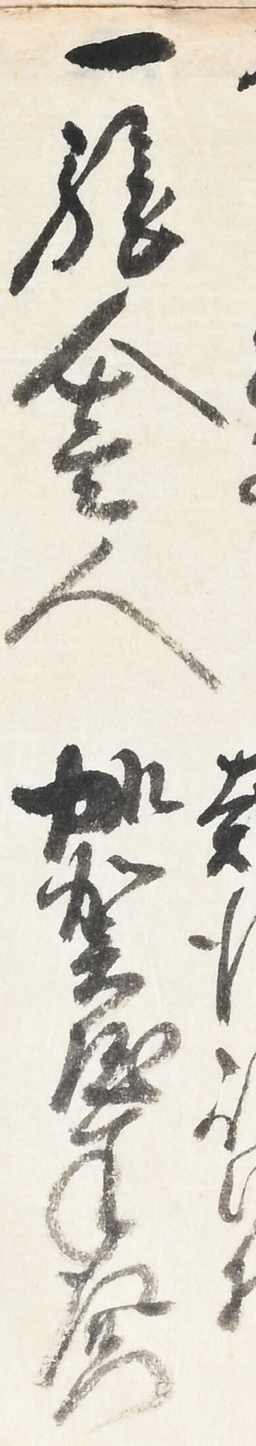一旅人壱人加賀屋半左衛門
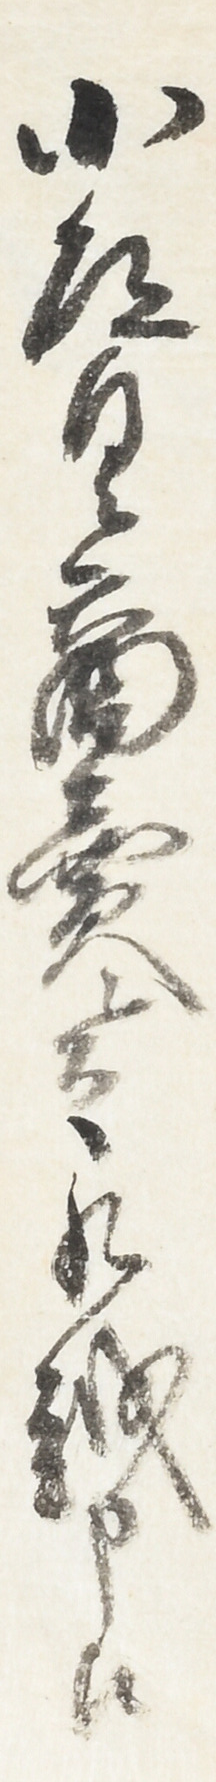小道具商売ニ而罷越申候

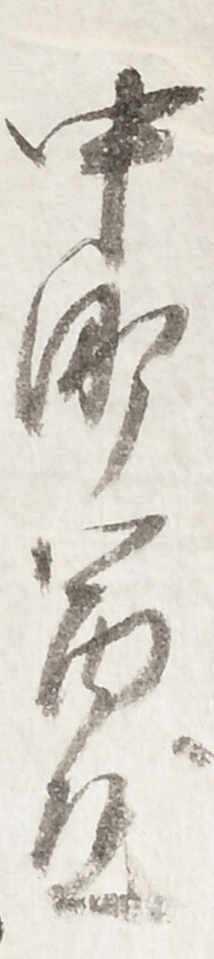中町冨屋
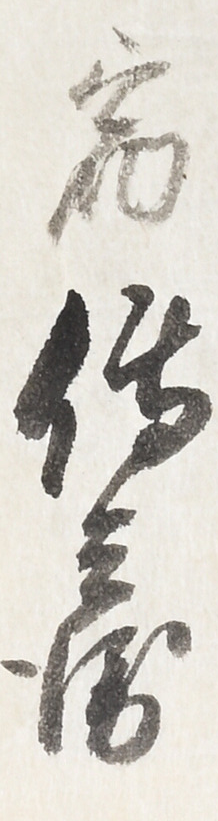宿伝兵衛
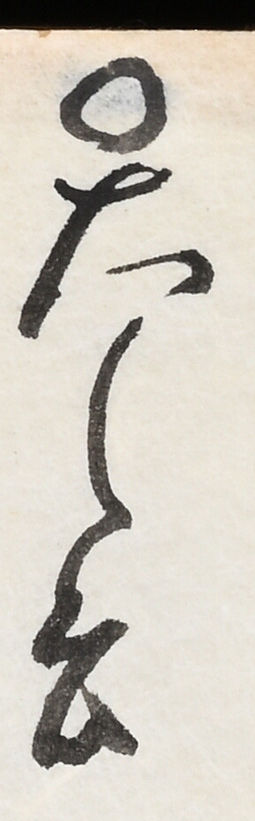〇右之者
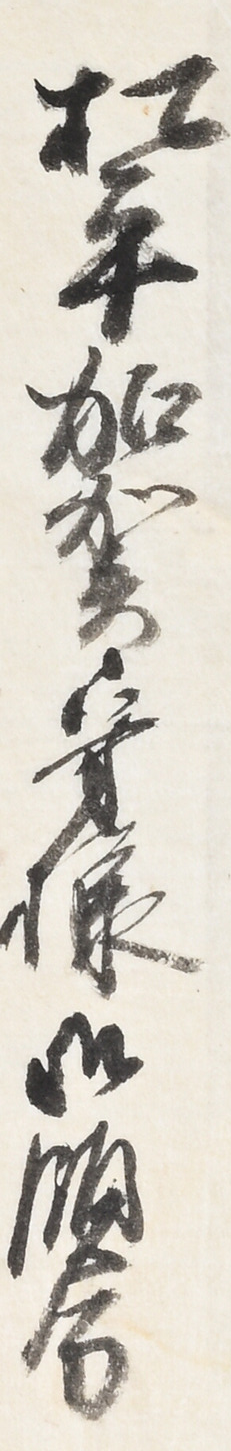松平加賀守様御領分
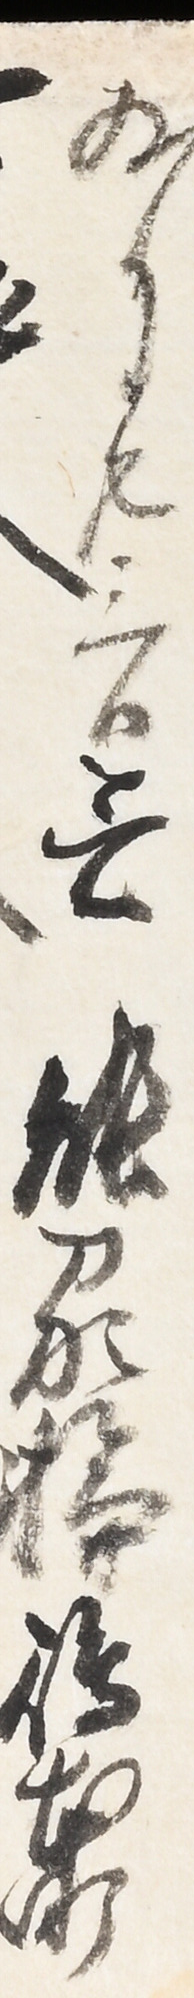九月廿三日着能州輪嶋本町
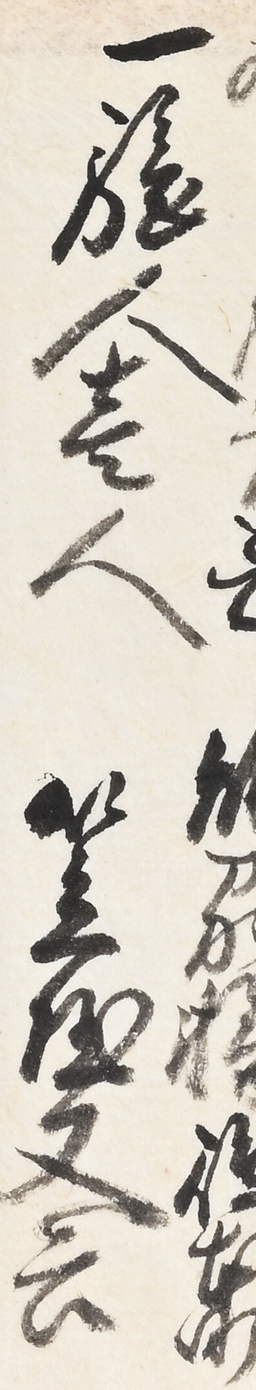一旅人壱人笠屋又六
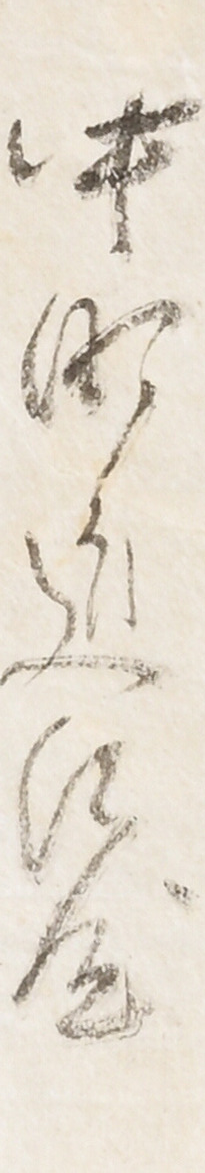中町近江屋
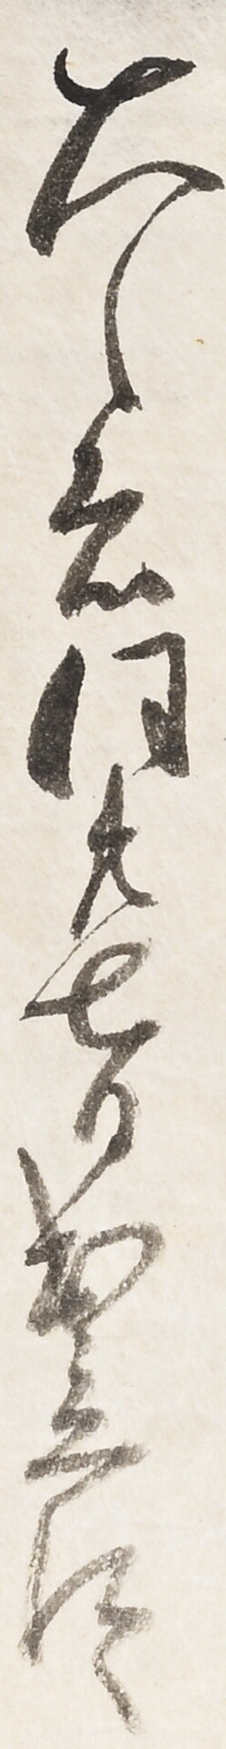右之者同廿七日出立仕候
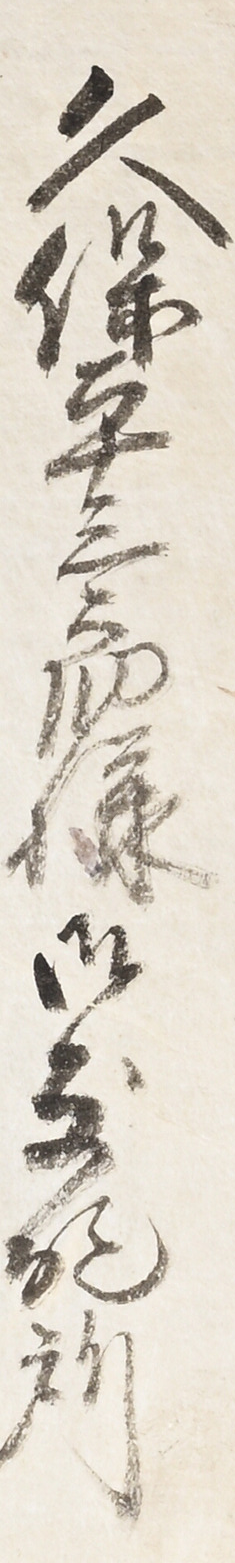久保平三郎様御支配所
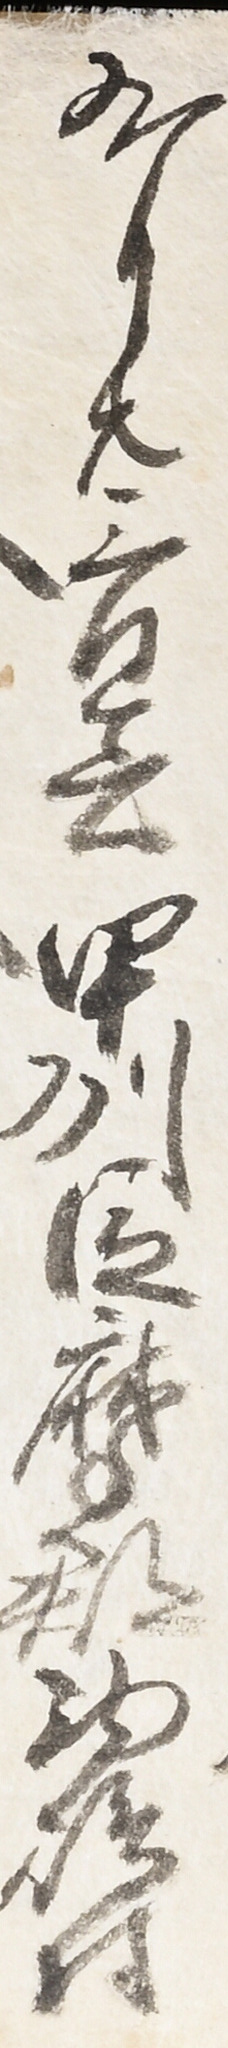九月廿三日着甲州巨摩郡西嶋村
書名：旅人泊控帳
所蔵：伊那市立高遠町図書館・合同会社AMANE
